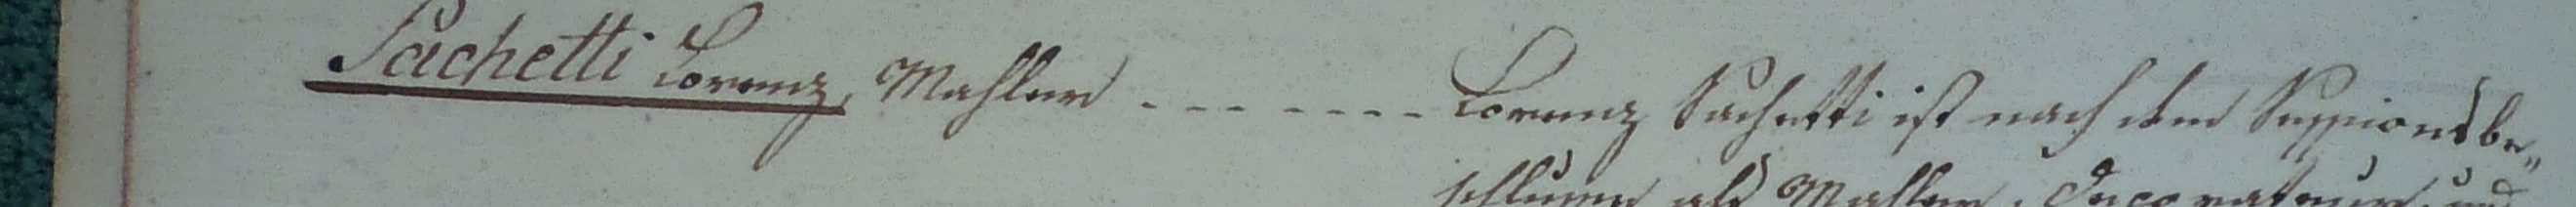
Sachetti Lorenz, Mahler ……. Lorenz Sachetti ist nach dem Sessionsbe¬
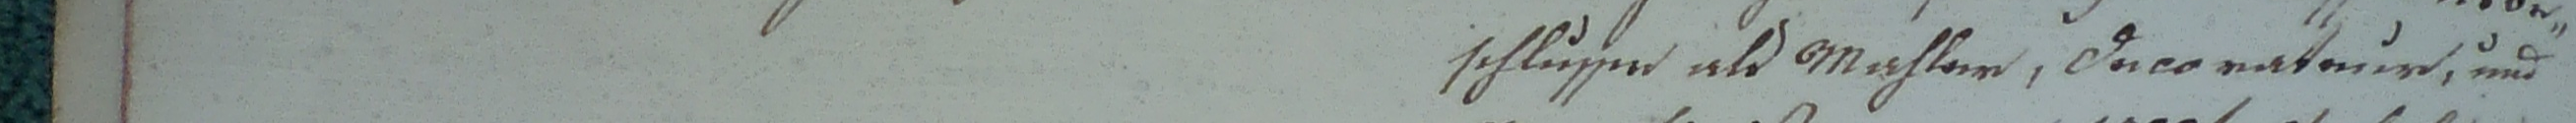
schlusse als Mahler, Decorateur, und
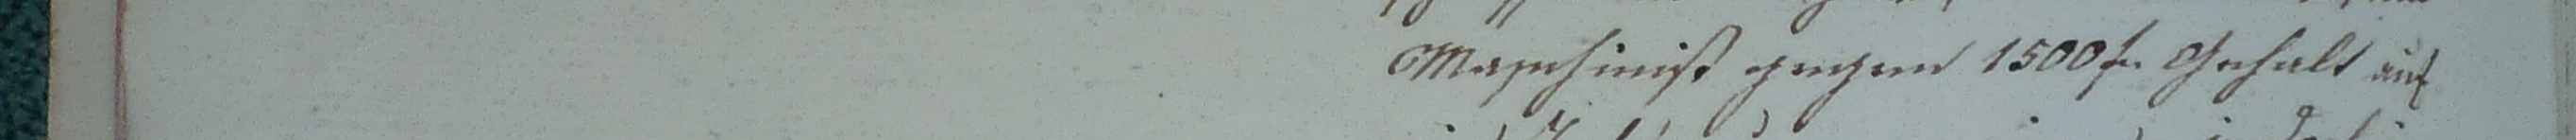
Maschinist gegen 1500fn Gehalt auf
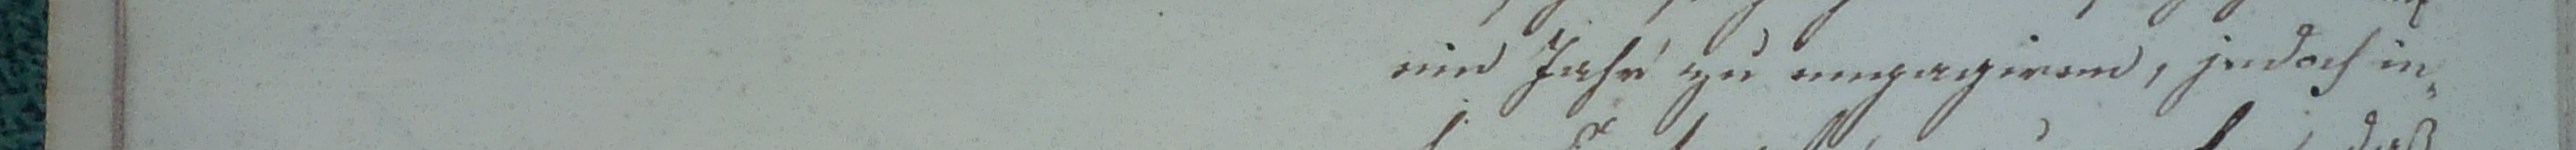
ein Jahr zu engagiren, jedoch in
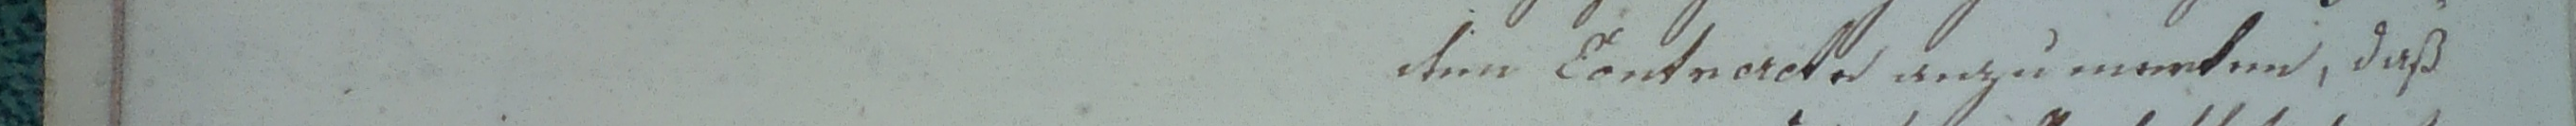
den Contracte anzu merken, daß
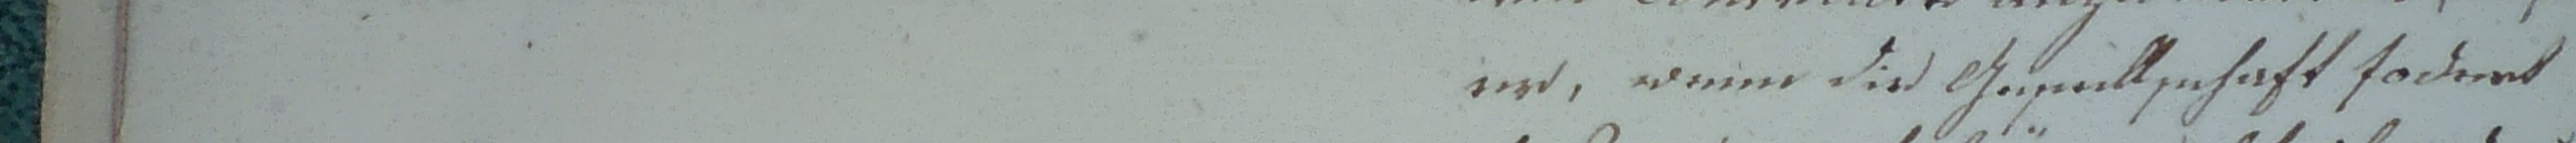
er, wenn die Gesellschaft fodert
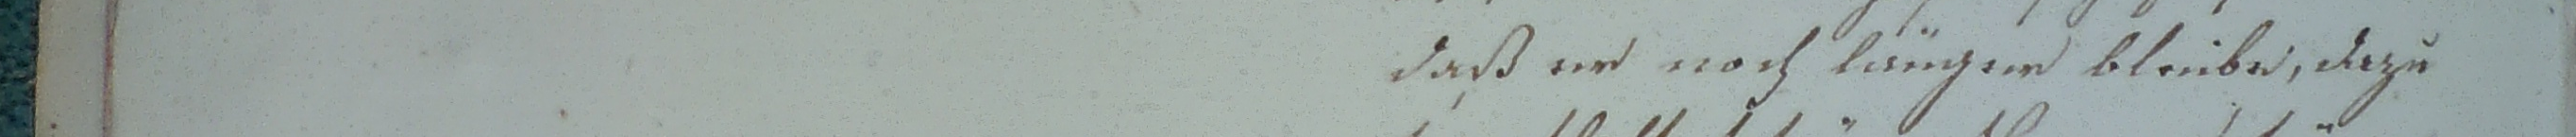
daß er noch länger bleibe, dazu
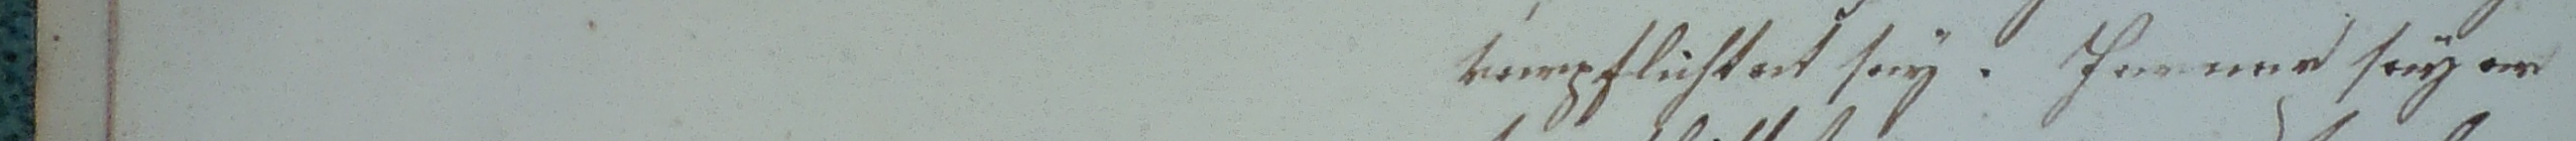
verpflichtet sey. Ferner sey er
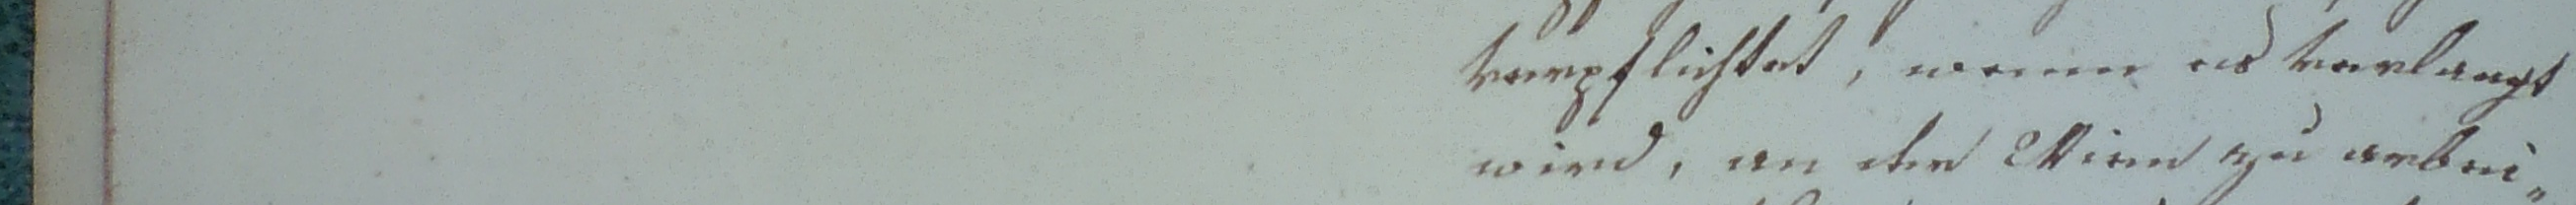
verpflichtet, wenn es verlangt
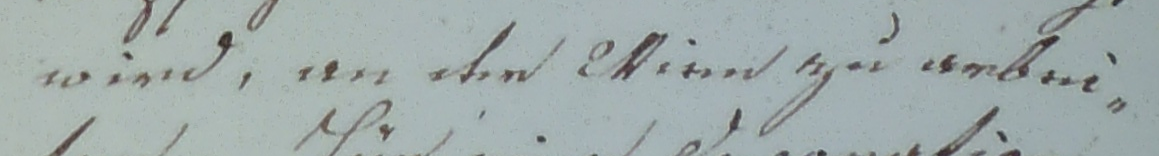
wird, an der Wien zu arbei¬
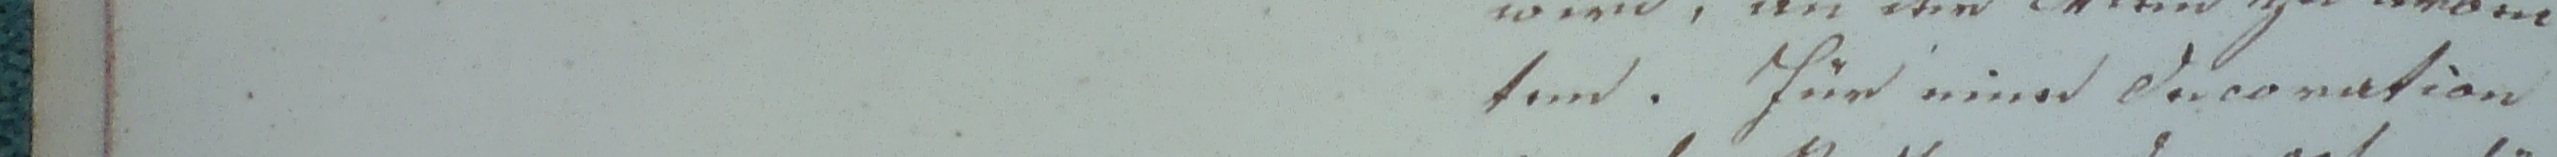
ten. Für eine Decoration
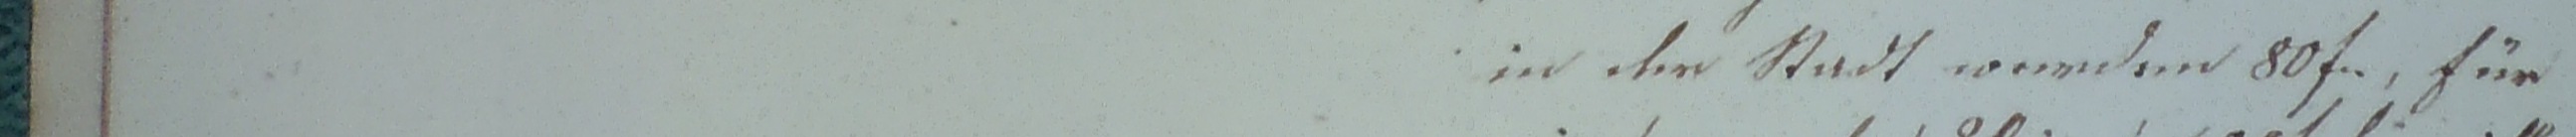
in der Stadt werden 80fn, für
